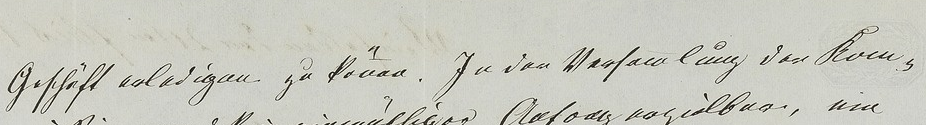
Geschäft erledigen zu können. In der Versammlung der Kom-
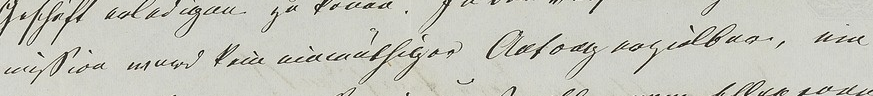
mission ward kein einmüthiger Antrag erzielbar, ein
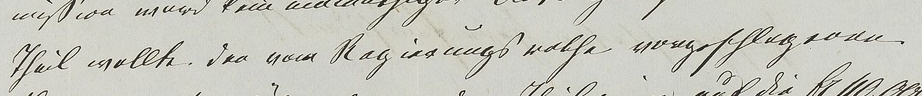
Theil wollte den vom Regierungsrathe vorgeschlagenen
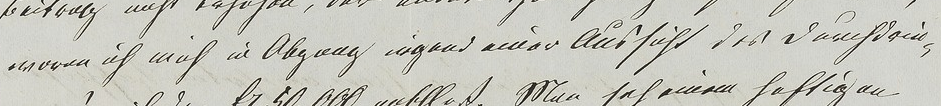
woran ich mich in Abgang irgend einer Aussicht des Durchdrin-
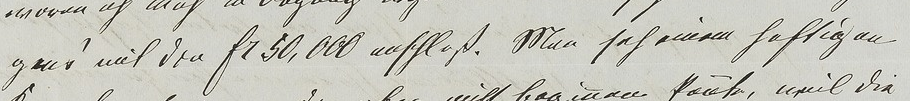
gens mit den fr 50,000 anschloß. Man sah einem heftigen
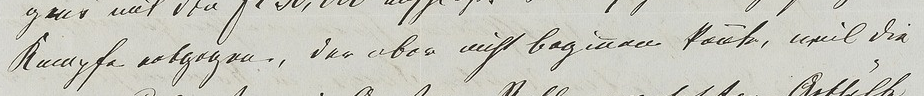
Kampfe entgegen, der aber nicht beginnen konnte, weil die
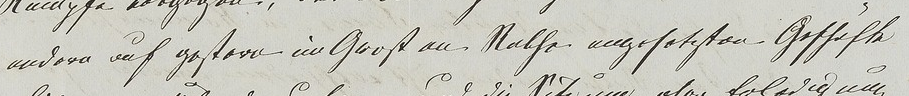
andern auf gestern im Großen Rathe angesetzten Geschäfte
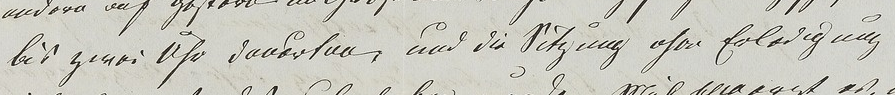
bis zwei Uhr dauerten, und die Sitzung ohne Erledigung
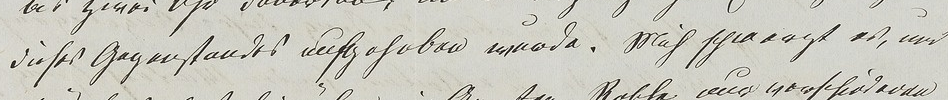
dieses Gegenstandes aufgehoben wurde. Mich schmerzt es, und
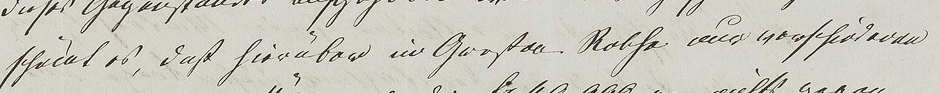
schämt es, daß hierüber im Großen Rathe nur verschiedenen
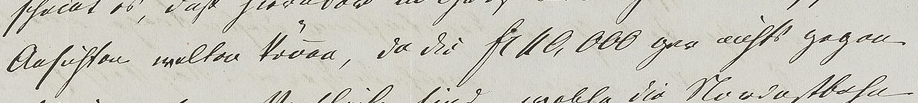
Ansichten walten können, da die fr 40,000 gar nichts gegen
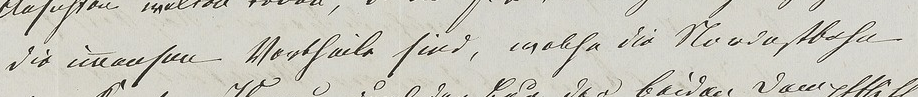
die immensen Vortheile sind, welche die Nordostbahn
